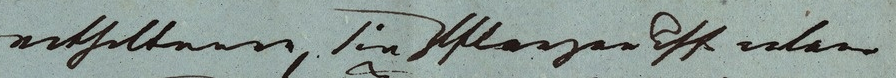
enthaltenen, die Pflanzen usf. anlan-
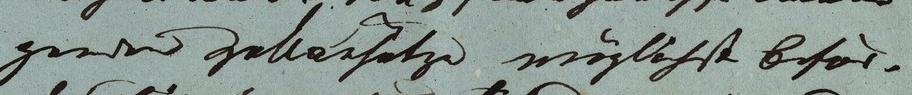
genden Zollansätze möglichst beför-
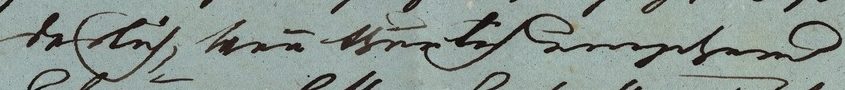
derlich, wenn thunlich umgehend
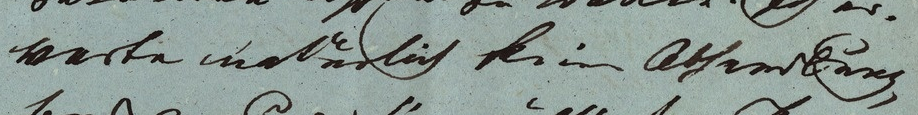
warte natürlich keine Abhandlung,
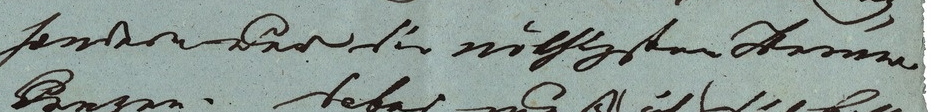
sondern nur die nöthigsten Bemer-
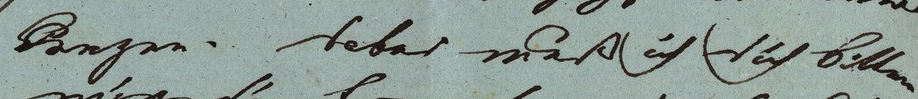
kungen. Dabei muß ich dich bitten
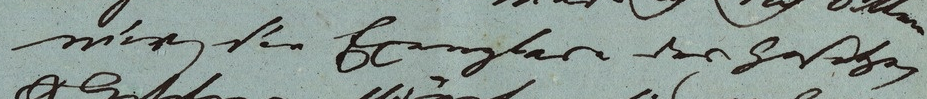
mir die Exemplare des Gesetzes
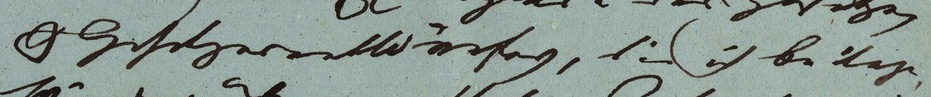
& Gesetzesentwurfes, die ich beilege,
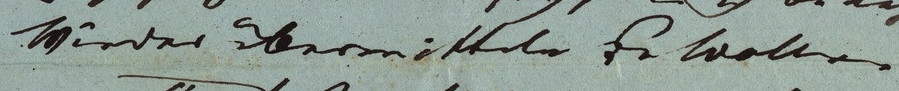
wieder übermitteln zu wollen.
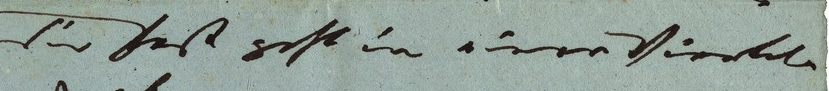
Die Post geht in einer Viertel-
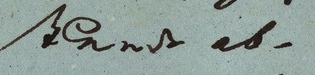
stunde ab.
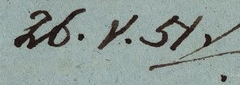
26. V. 51
